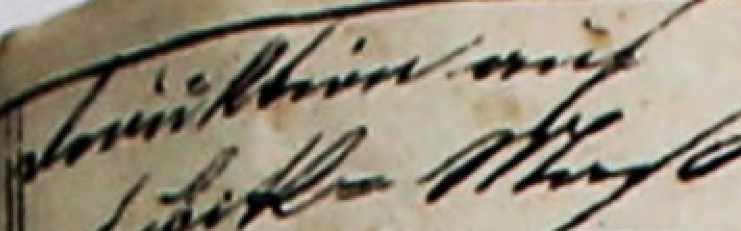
Reduktion auf
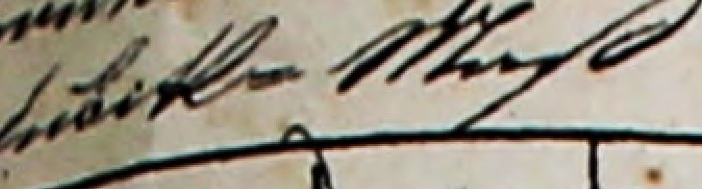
Cubik= Maß
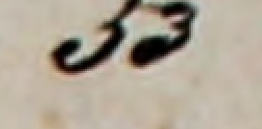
53
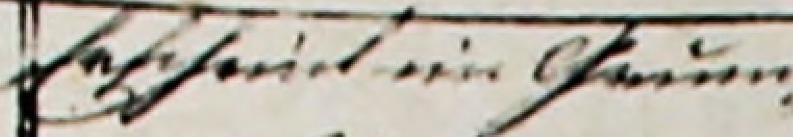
Erscheint im Grund„
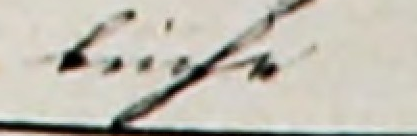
buche
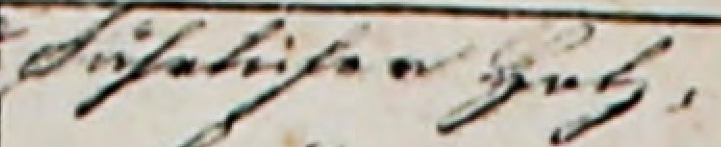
Jährlicher Holz„
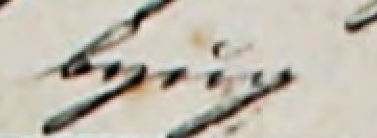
bezug
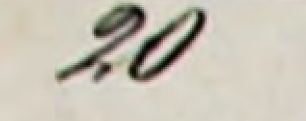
20
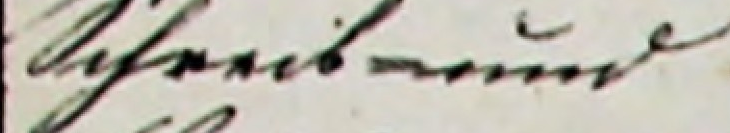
Schreib = und
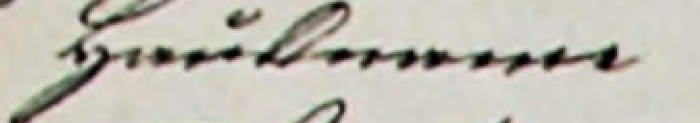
Hausmann
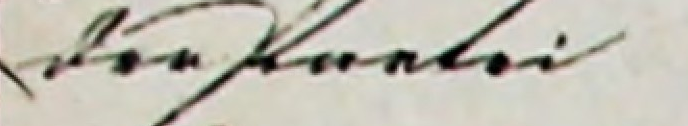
der Partei
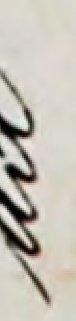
ad
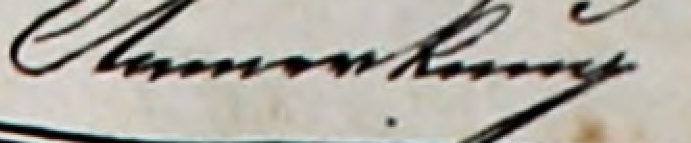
Anmerkung
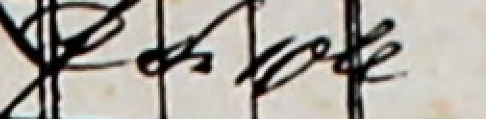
???
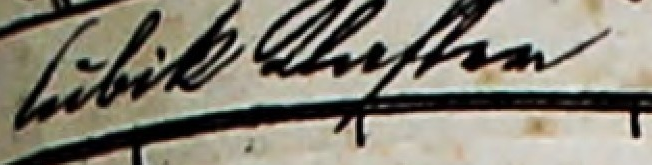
Cubik Klafter
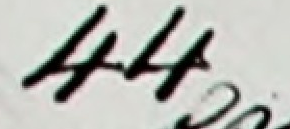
44
